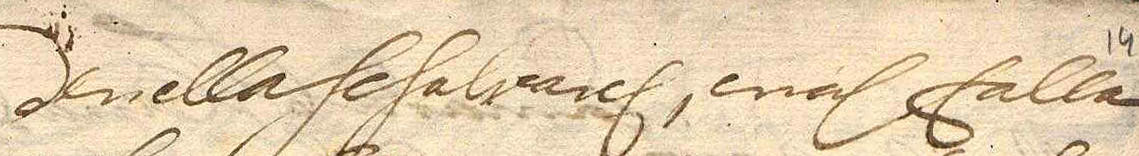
de nella se salvareꝭ, e naꝭ falla
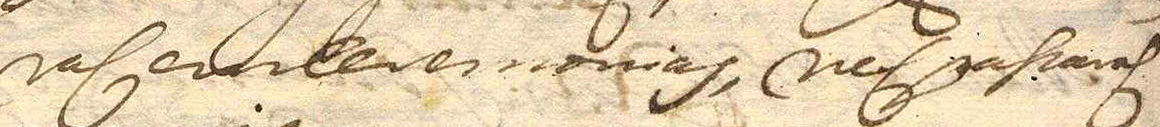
raõ em ceremonias, neꝭ passaraꝭ
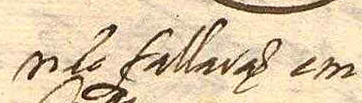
não fallaraõ em
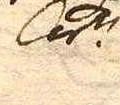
Cer.as
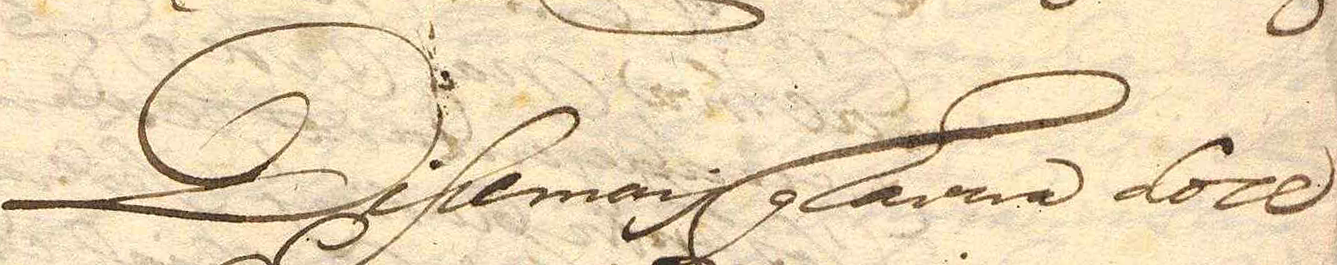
Disse mais q̄ havera doze
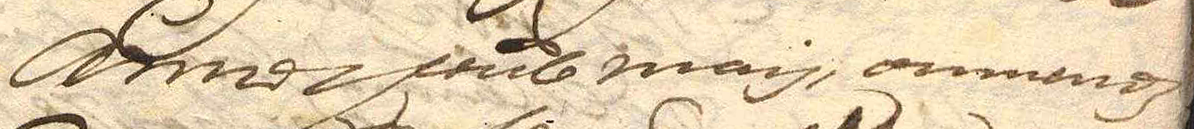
annos pouco mais, ou menos
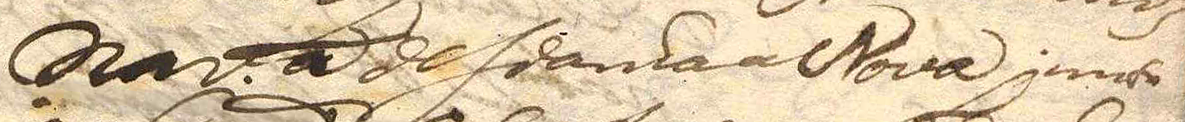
na v.a de Jdanha a Nova junto
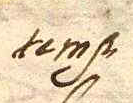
temp
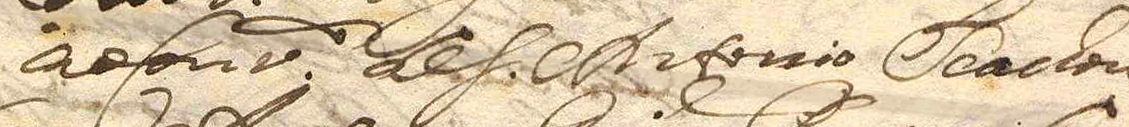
ao Conv.to de s. Antonio Se achou
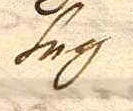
lug
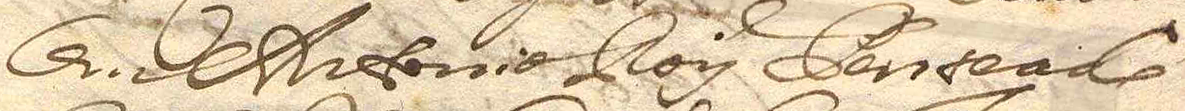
Com Antonio Rois̄ Penteado
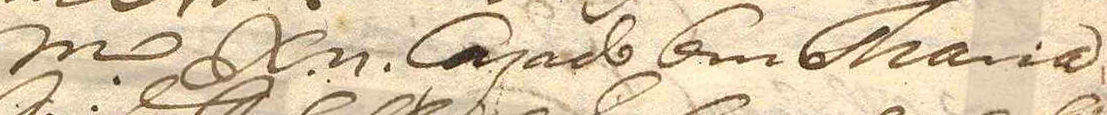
m.o x.n. Cazado Com Maria
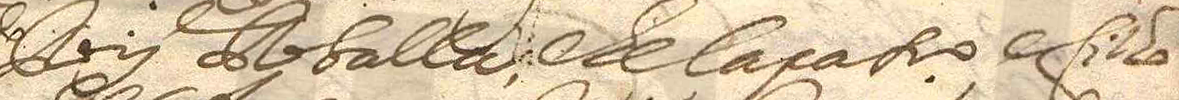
Rois̄ Roballa; e he Çapatr.o, e filho
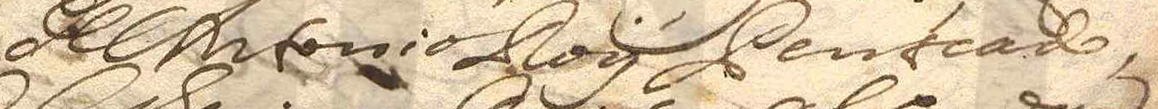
de Antonio Rois̄ Penteado,
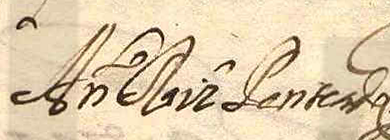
Anto Roiz̄ Penteado
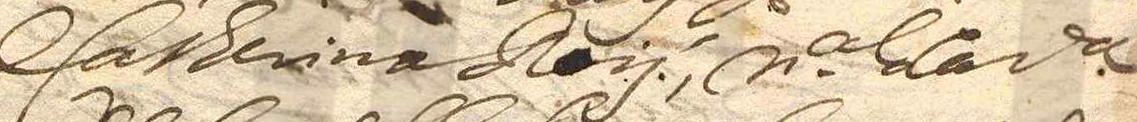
E Catherina Rois̄, n.al da v.a
